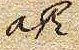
a R.
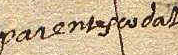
parentesco da ta
